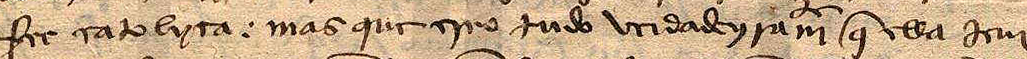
fee catolyca : mas que creo tudo verdadeyramte q̄ ella tem
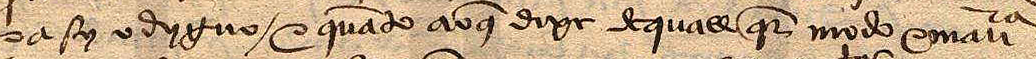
e asy o dyguo / e qūato ao q̄ dixe de qualq̄r modo e manra
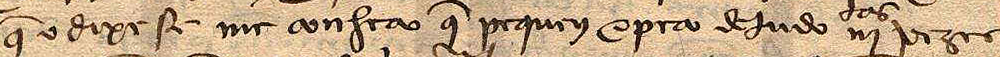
q̄ o dixese me conheço q̄ pequey e peco de tudo mtas vezes
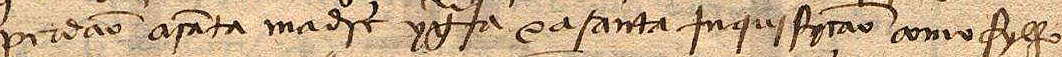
perdão a s̄ata madre yḡJa e a santa Jnqujsyção como fylho
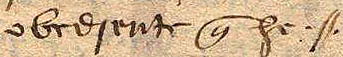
obedjente q̄ he ://.
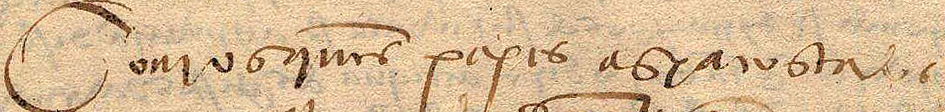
Com os qūes papes asy acostados
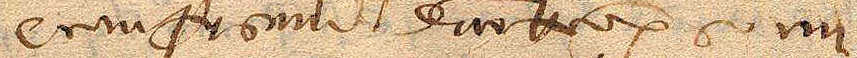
e comfysam do dito Reo p̄so em
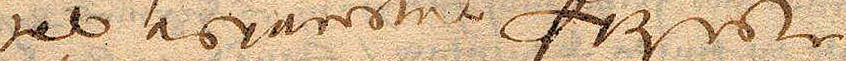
tudo asy acostado fiz este
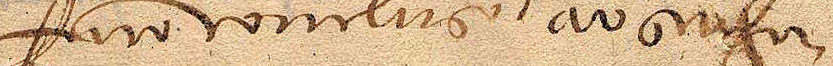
fēco concluso ao senhor
